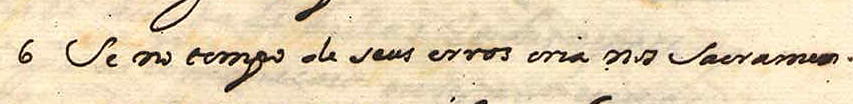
6 Se no tempo de seus erros cria nos Sacramen
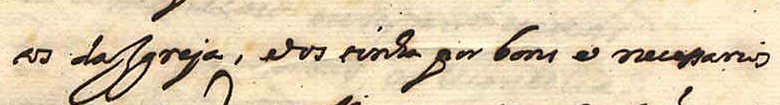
tos da Jgreja, e os tinha por bons e necessarios
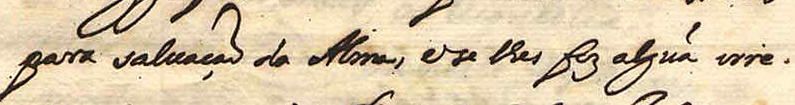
para saluaçaõ da Alma, e se lhes fez alguā irre
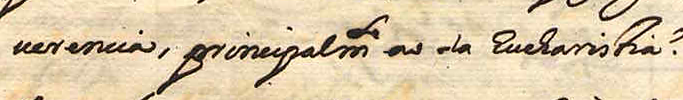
uerencia, principalmte no da Eucharistia.
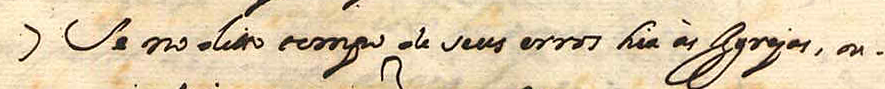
7 Se no ditto tempo de seus erros hia às Jgrejas, ou
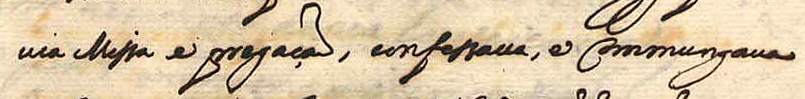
uia Missa e pregaçaõ, confessaua, e Commungaua
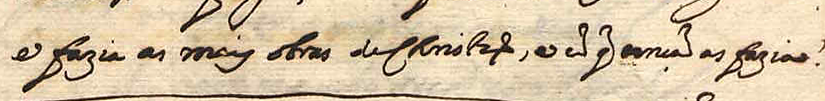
e fazia as mais obras de Christaõ, e cō q̄ tençaõ as fazia?
